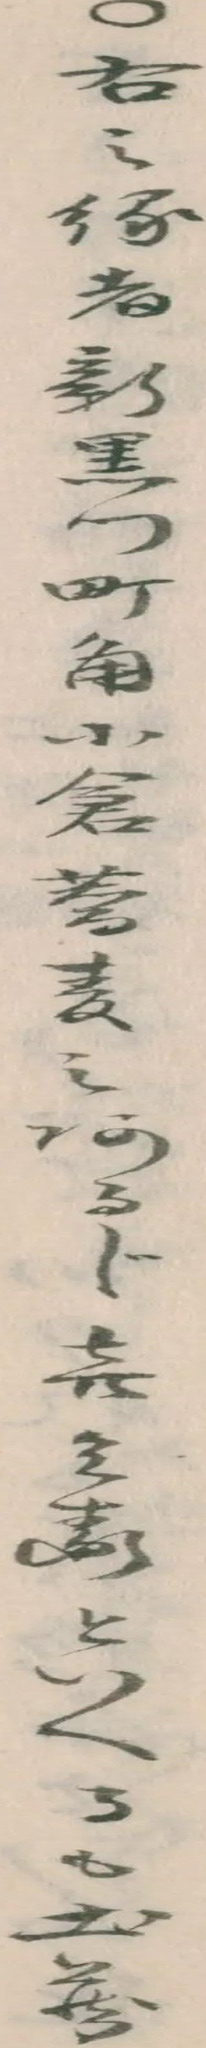〇右之縁者新黒門町角小倉蕎麦之あるじ喜兵衛といへるも土蔵
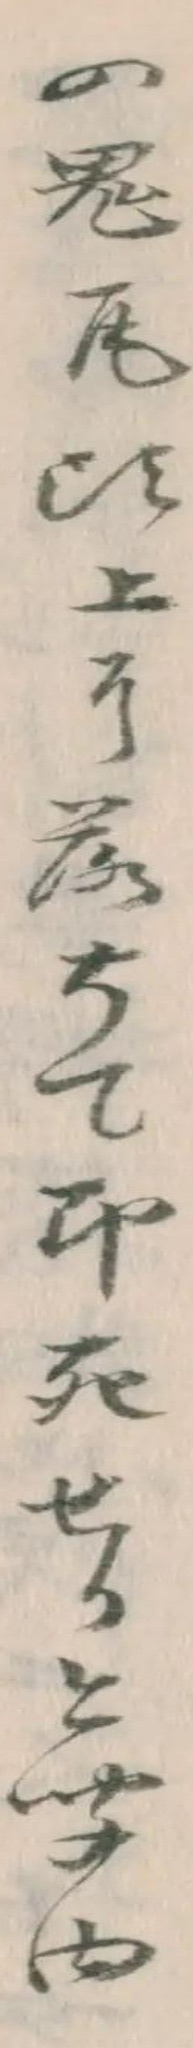の鬼瓦頭上に落ちて即死せりと聞ゆ
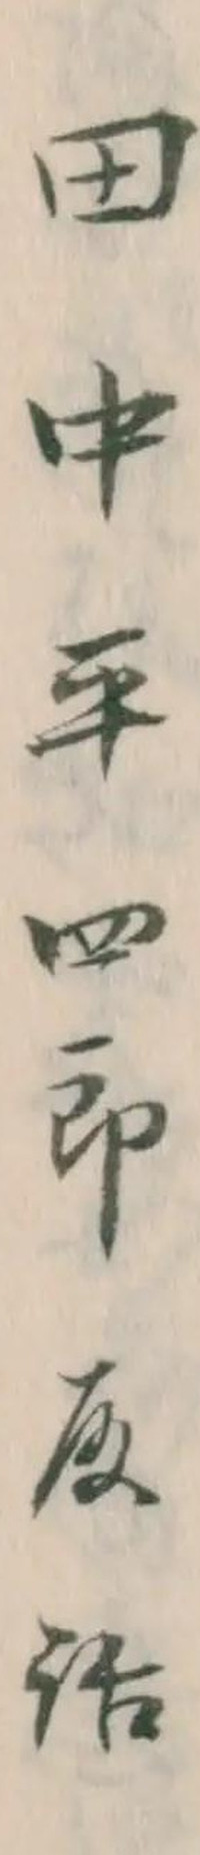田中平四郎殿話
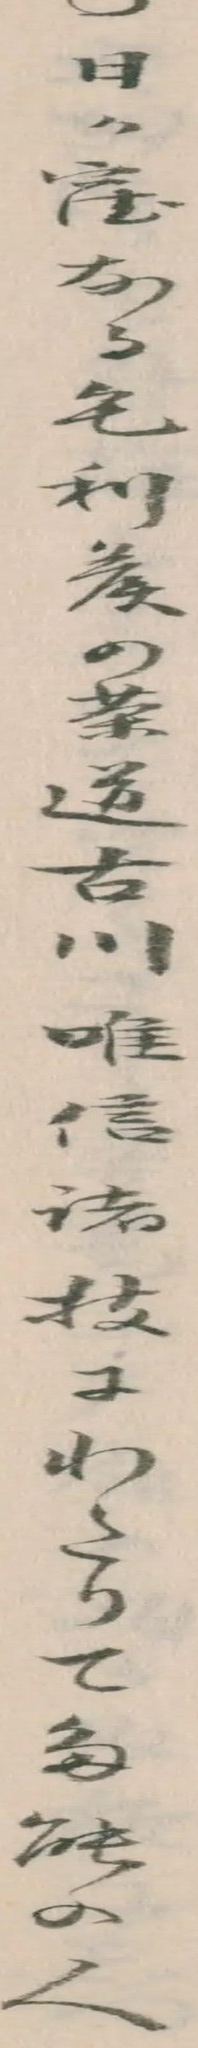日々窪なる毛利侯の茶道古川唯信諸技にわたりて多能の人
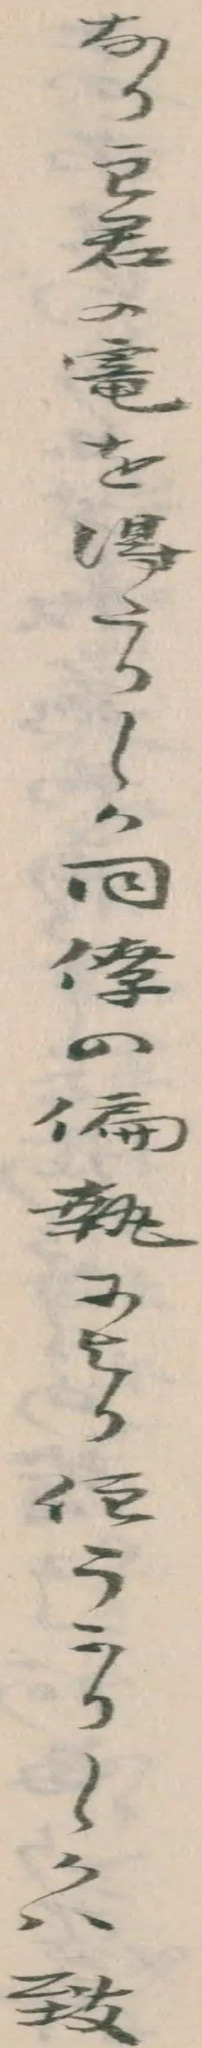なり主君の寵を得たりしか同僚の偏執により住うかりしかは致
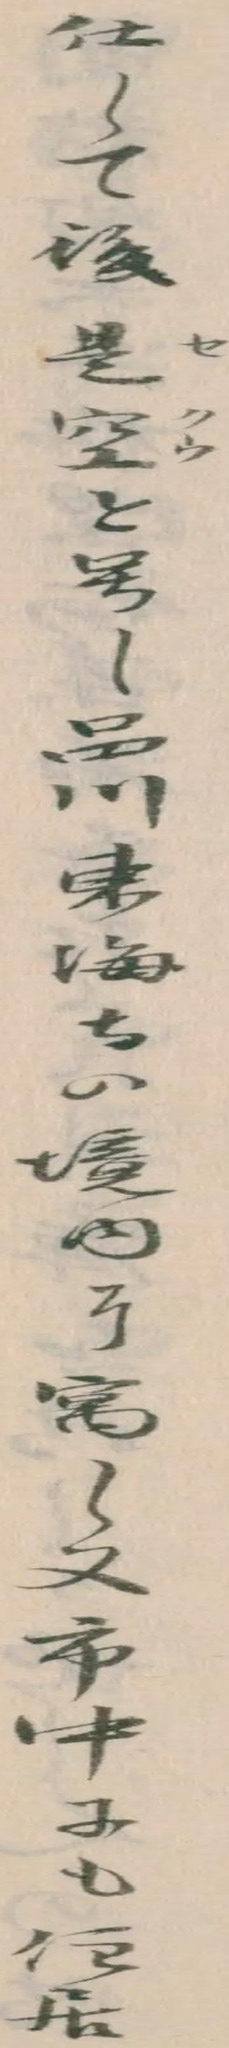仕して後是空と号し品川東海寺の境内に寓し又市中にも住居
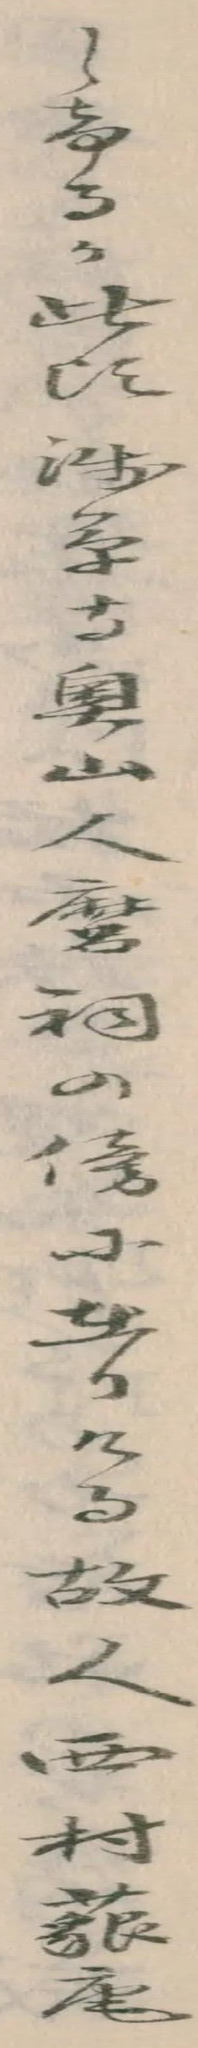しけるか此頃浅草寺奥山人麿祠の傍に在りける故人西村藐庵
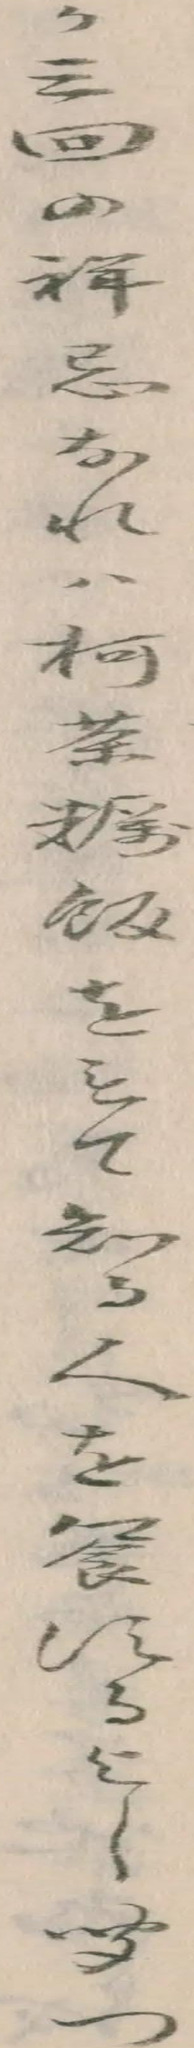か三回の祥忌なれは柯茶糲飯をもて知る人を饗するよし聞つ
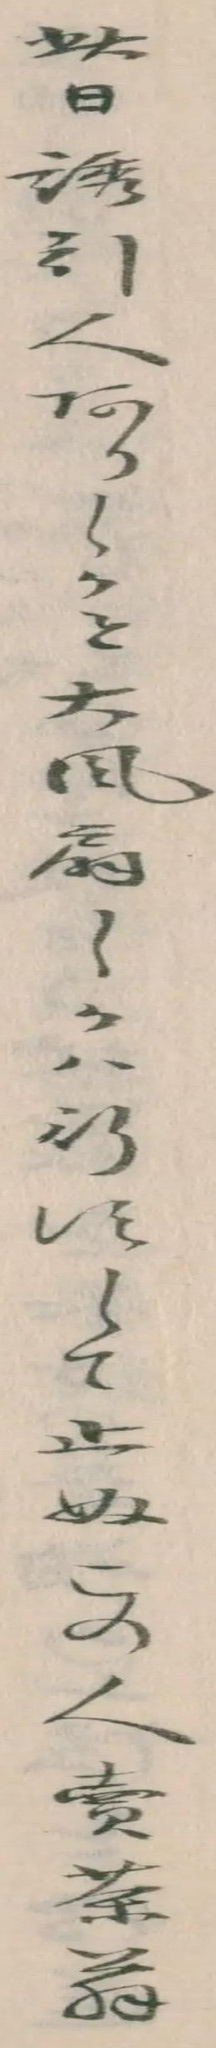此日誘引人ありしかと大風扇しかは行すして止ぬこの人売茶翁
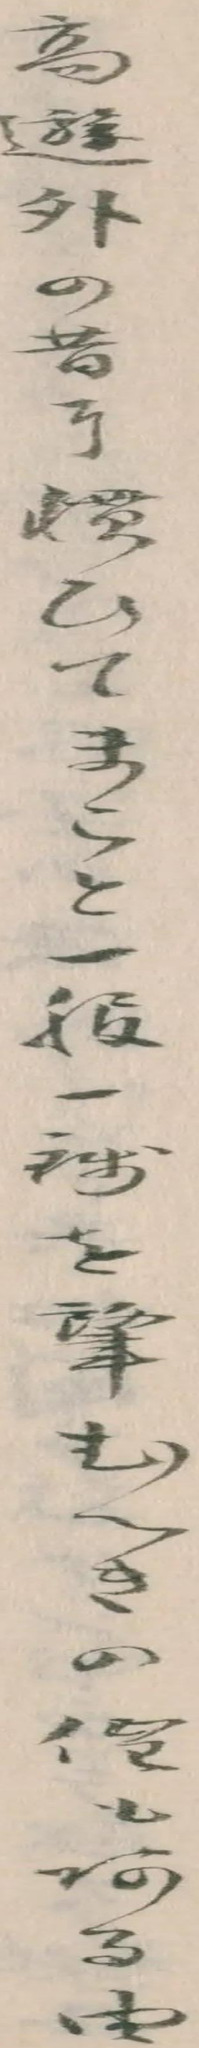高遊外の昔に慣ひてまこと一服一銭を肇むへきの催もある由
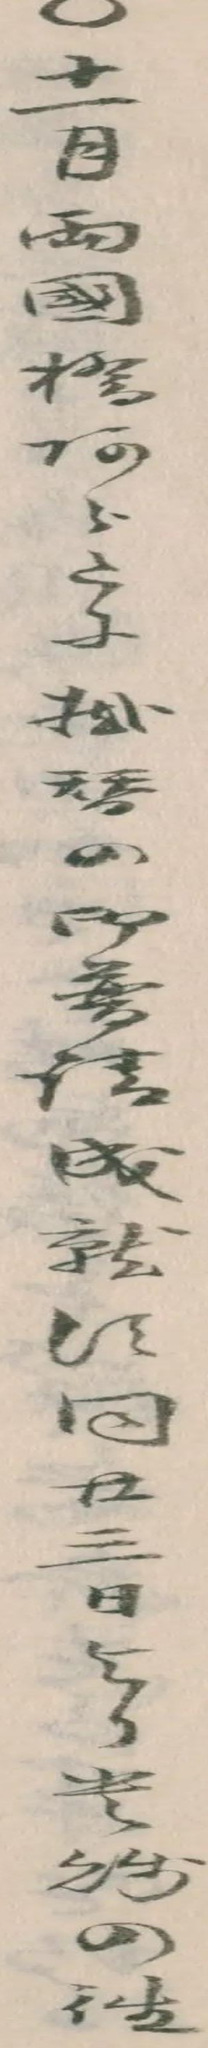〇十一月両国橋あらたに掛替の御普請成就す同廿三日より貴賤の往
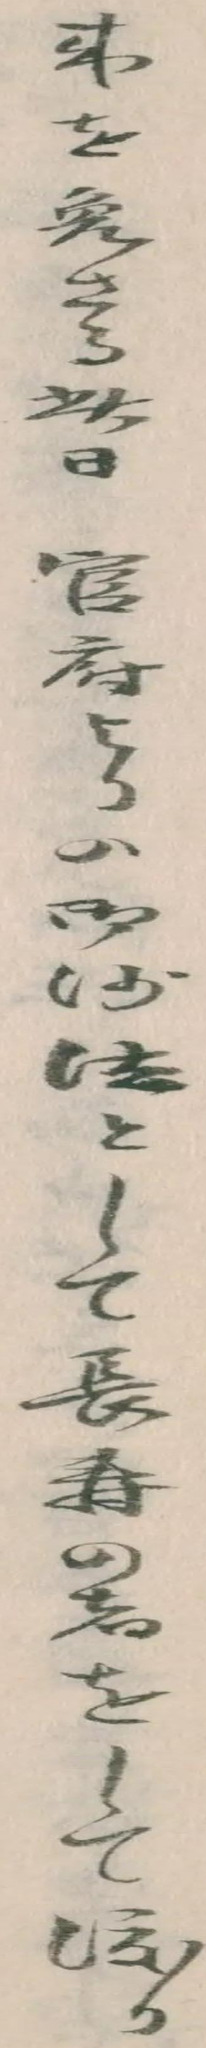来を免さる此日官府よりの御沙汰として長寿の者をして渡り
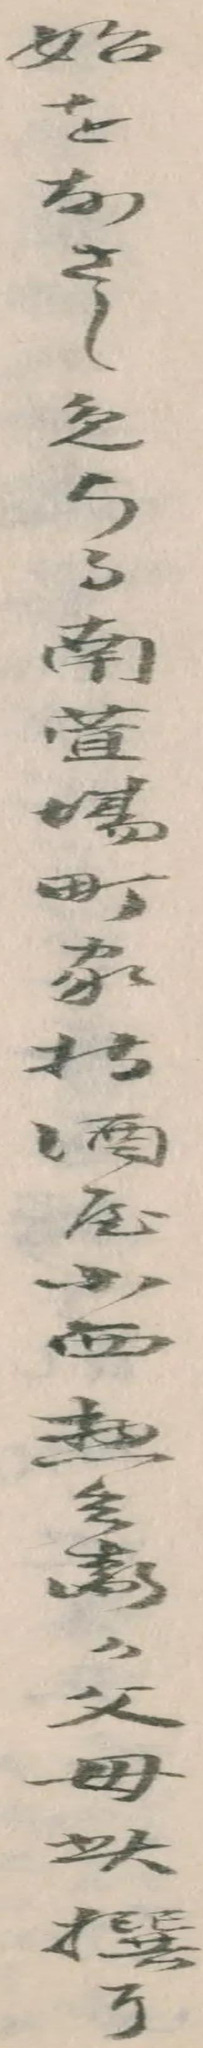始をなさしめらる南萱場町家持酒屋小西惣兵衛か父母此撰に
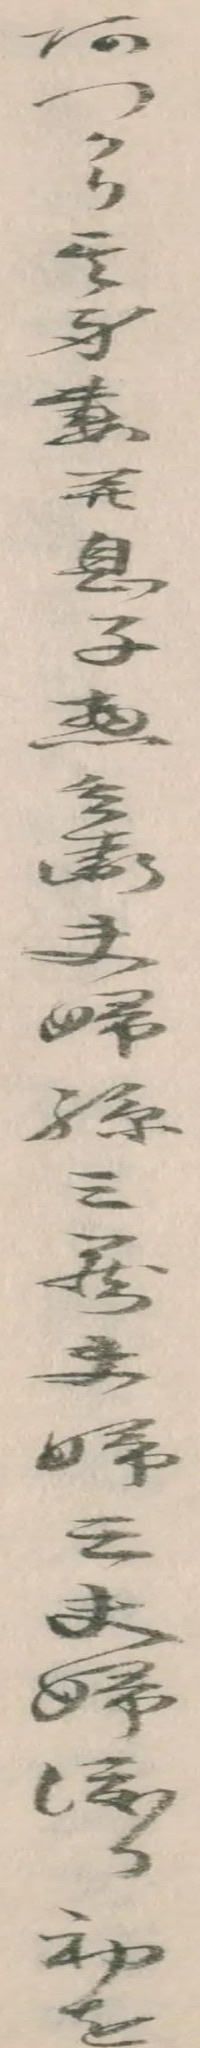あつかり其身妻并息子惣兵衛夫婦孫三蔵夫婦三夫婦渡り初を

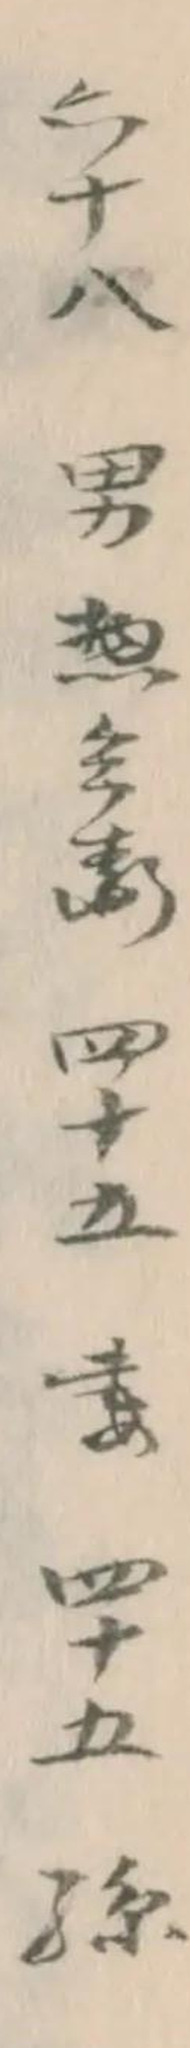六十八男惣兵衛四十五妻四十五孫
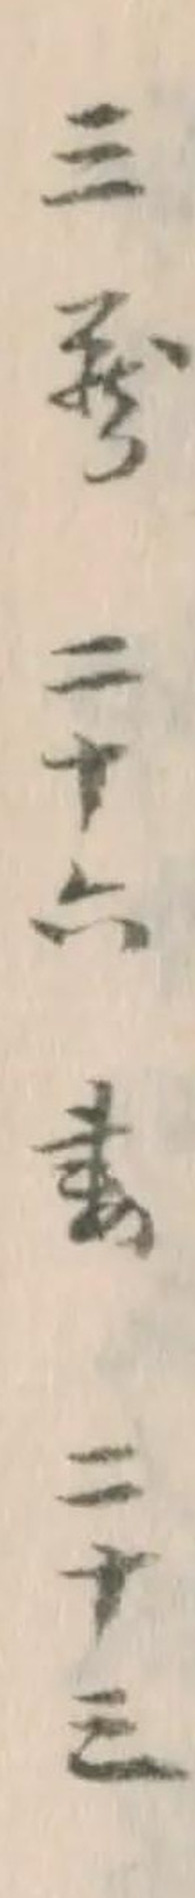三蔵二十六妻二十三
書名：地災撮要. 巻7-9(地震之部)
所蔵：国立国会図書館 National Diet Library, JAPAN
